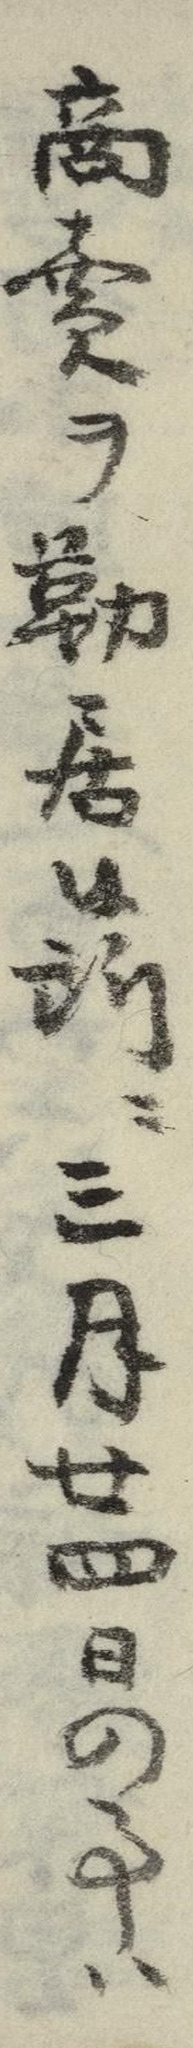商売ヲ勤居候所二三月廿四日の事ハ
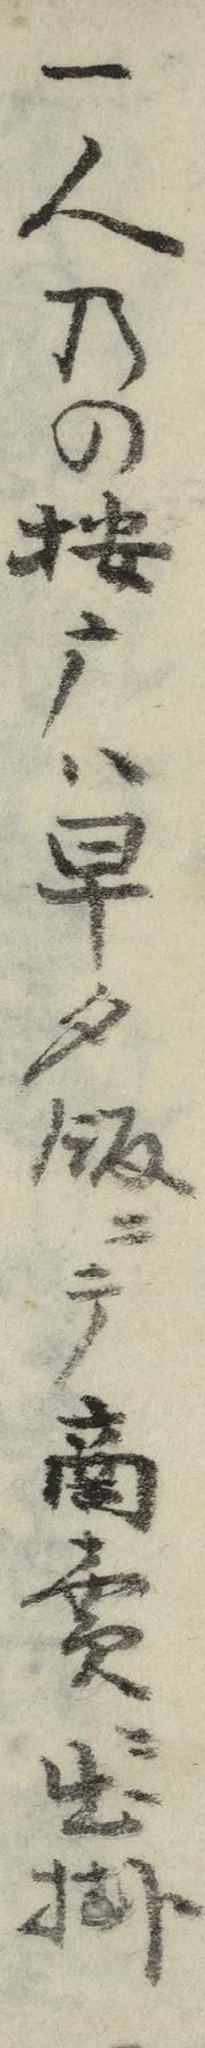一人乃按广ハ早夕飯ニテ商売二出掛

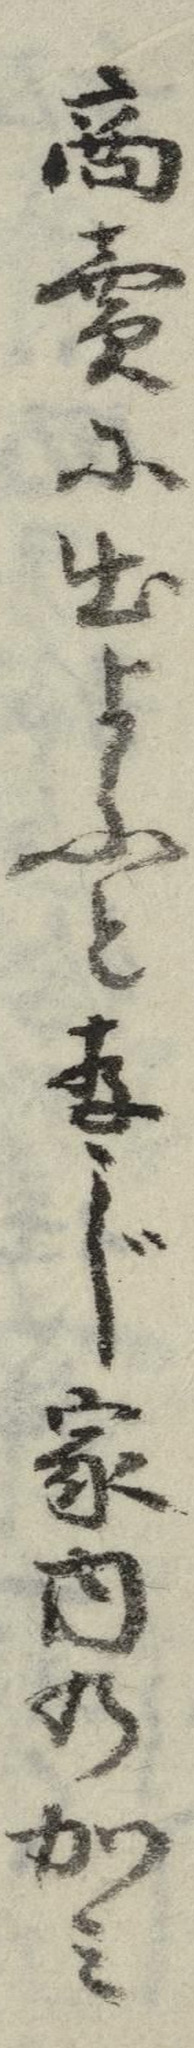商売に出よふと存じ家内乃かミ
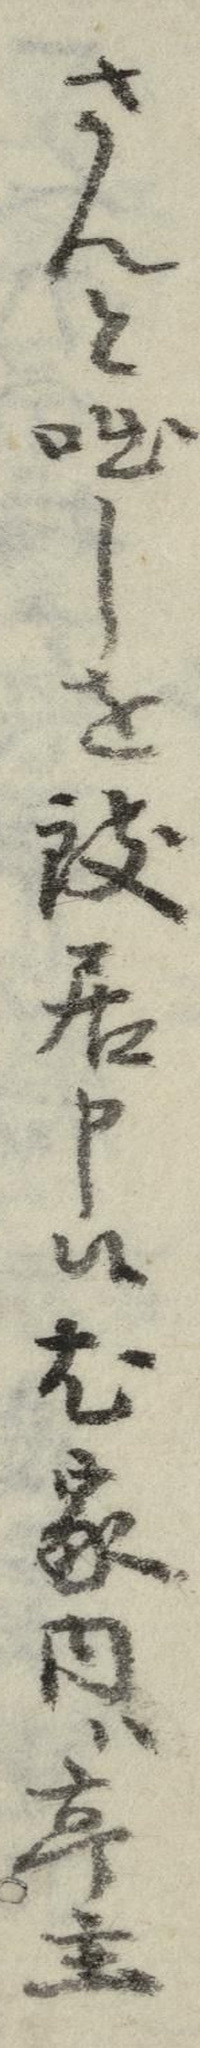さんと咄しを致居申候尤家内ハ亭主
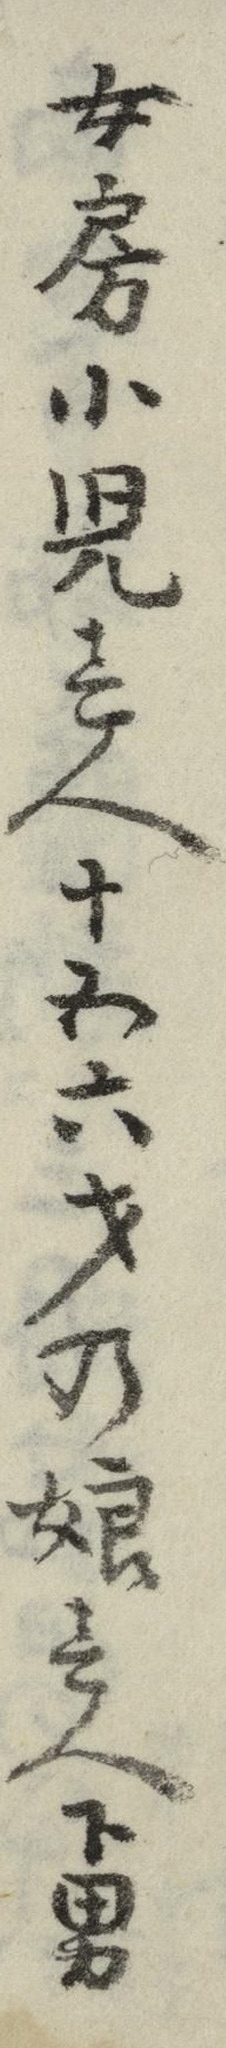女房小児壱人十五六才乃娘壱人下男
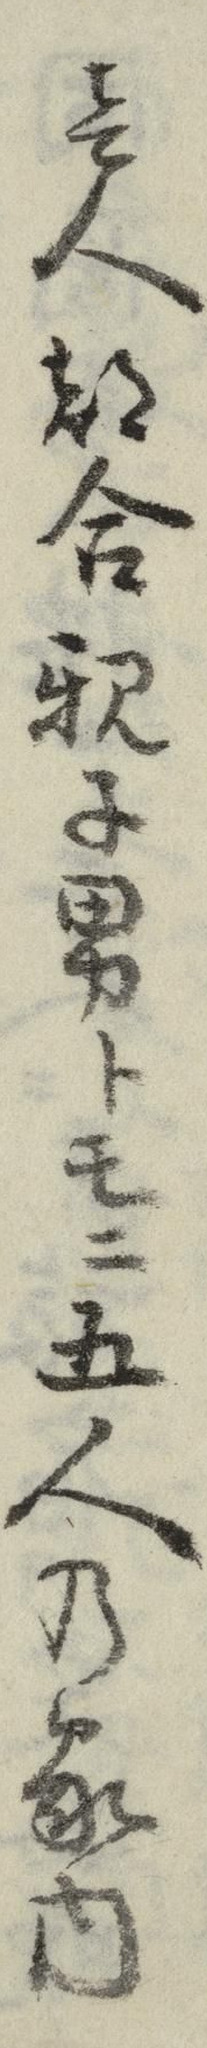壱人都合親子男トモニ五人乃家内
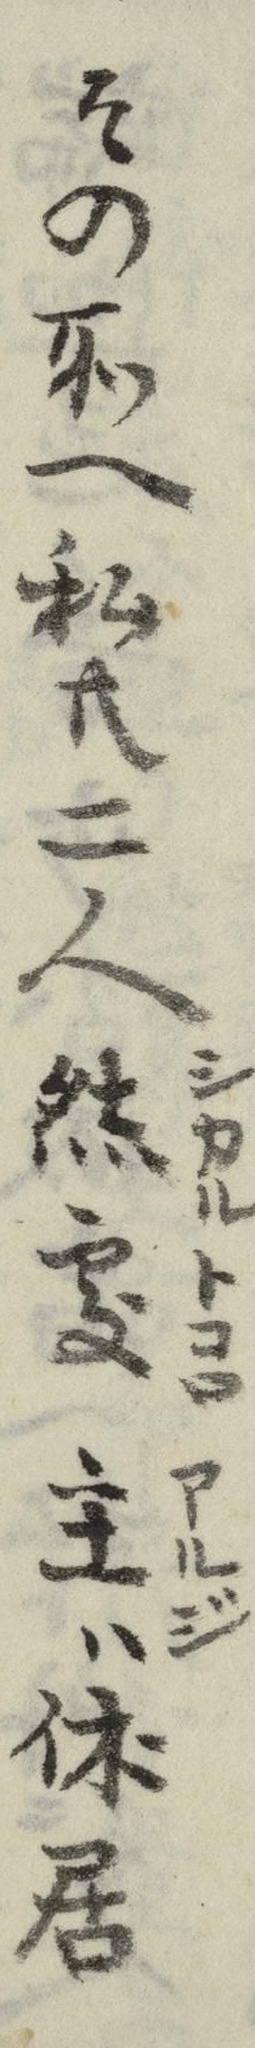その所へ私共二人然処主ハ休居
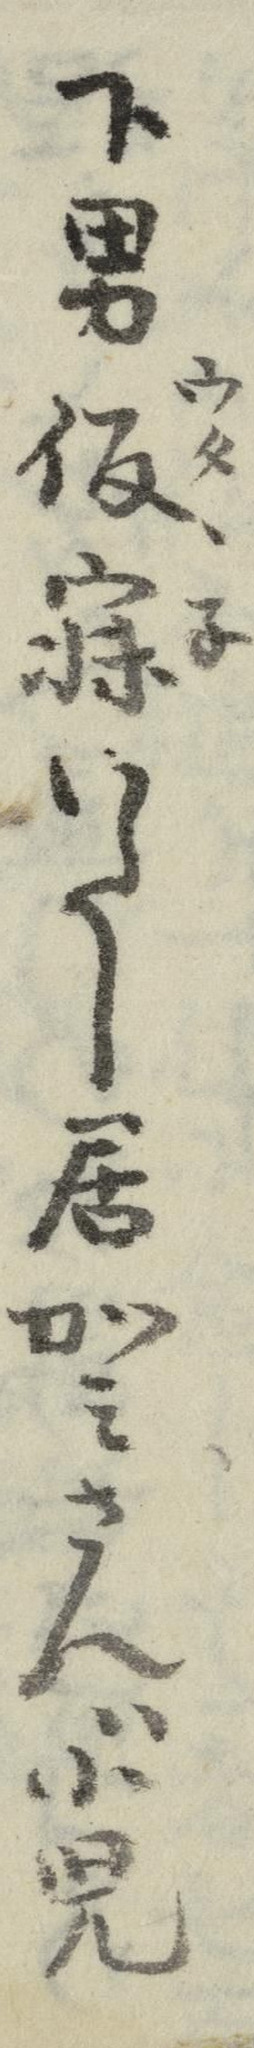下男仮寝いたし居かミさんハ小児
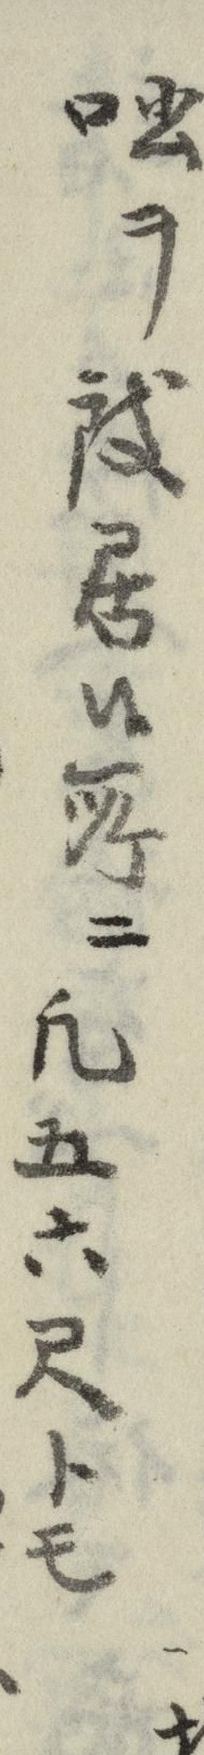咄ヲ致居候所二凡五六尺トモ思ふ程
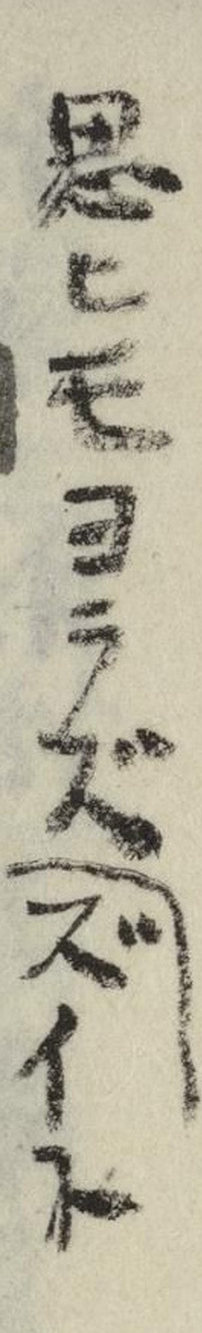思ヒモヨラズズイト
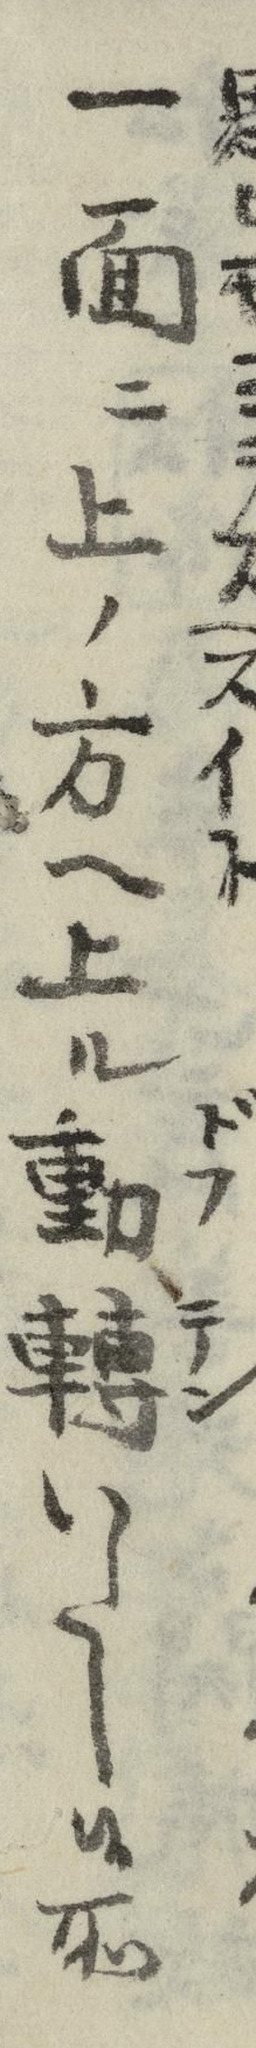一面二上ノ方へ上ル動転いたし候所
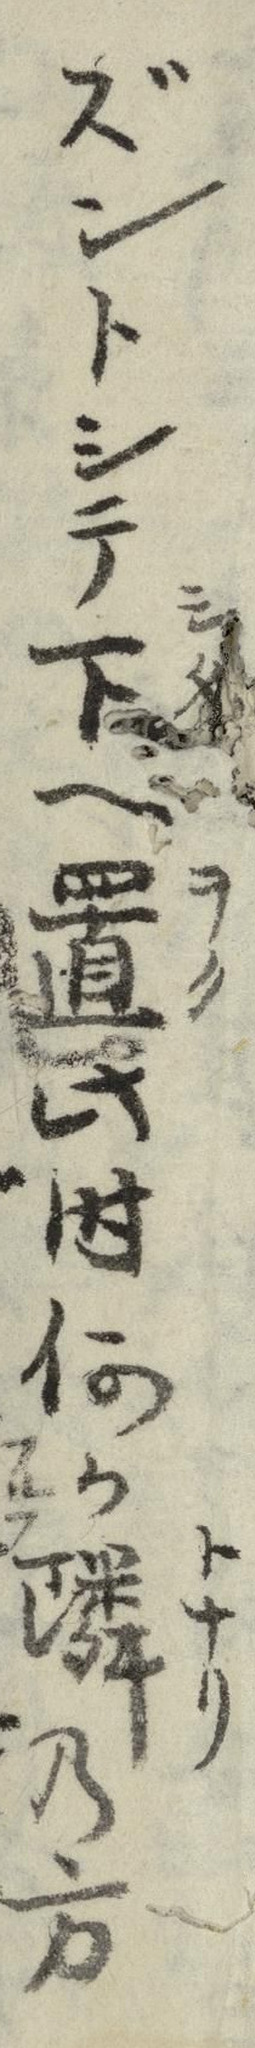ズントシテ下へ置此時何か隣乃方
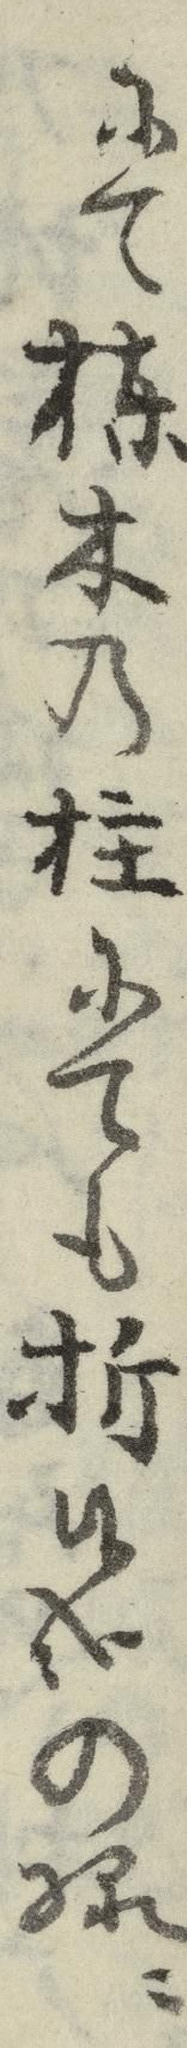にて棟木乃柱にても折候哉の様二
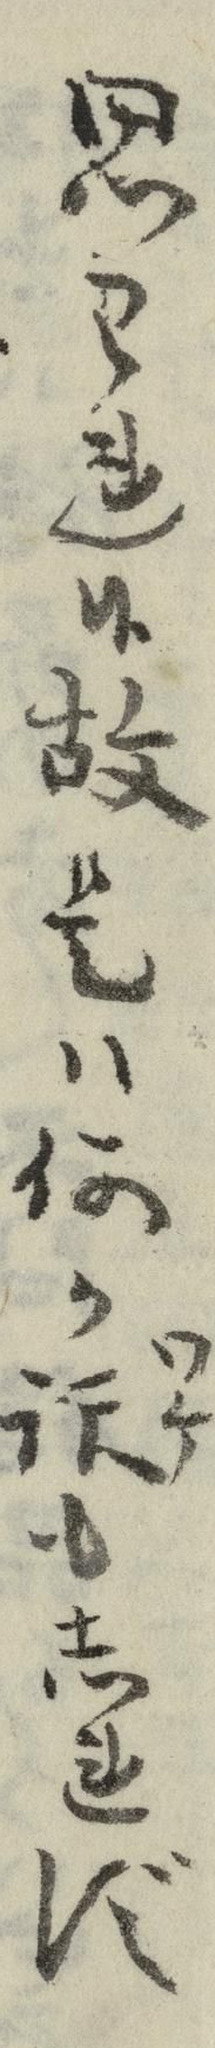思われ候故是ハ何か訳もしれず
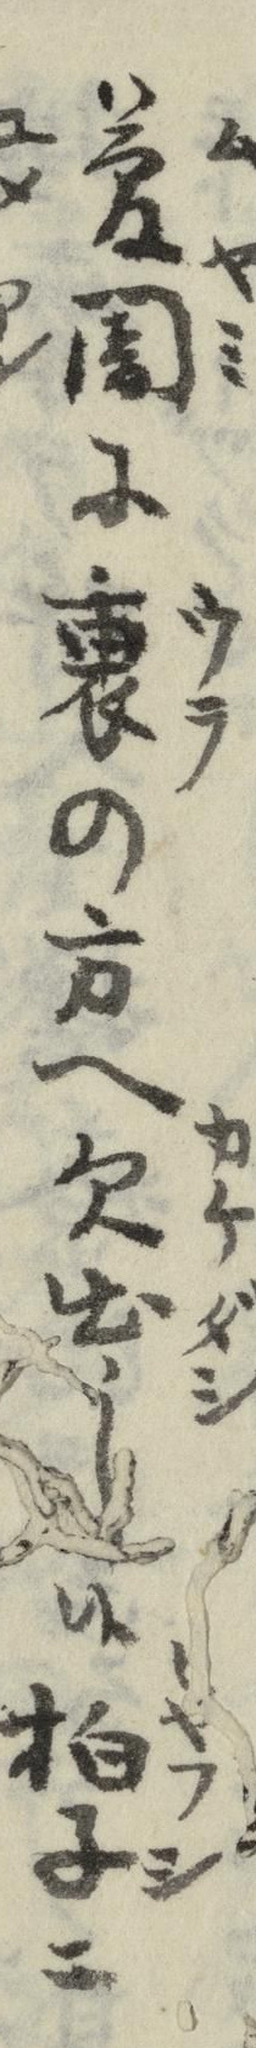夢闇に裏の方へ欠出し候拍子二
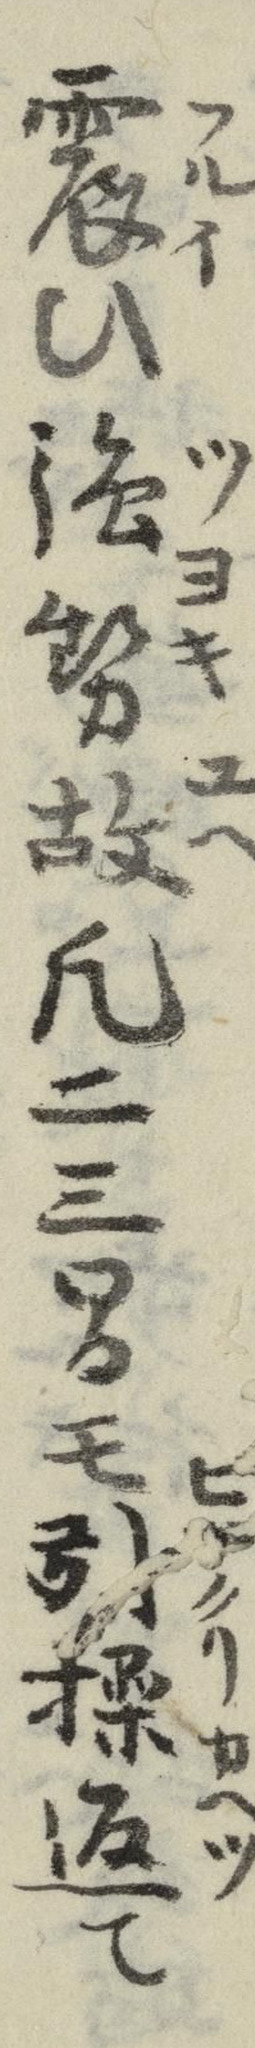震ひ強勢故凡二三間モ引繰返て
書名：信州大地震一件之冩　丁未弘化四年三月吉日
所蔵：東京大学地震研究所図書室 Earthquake Research Institute Library, The University of Tokyo, JAPAN
